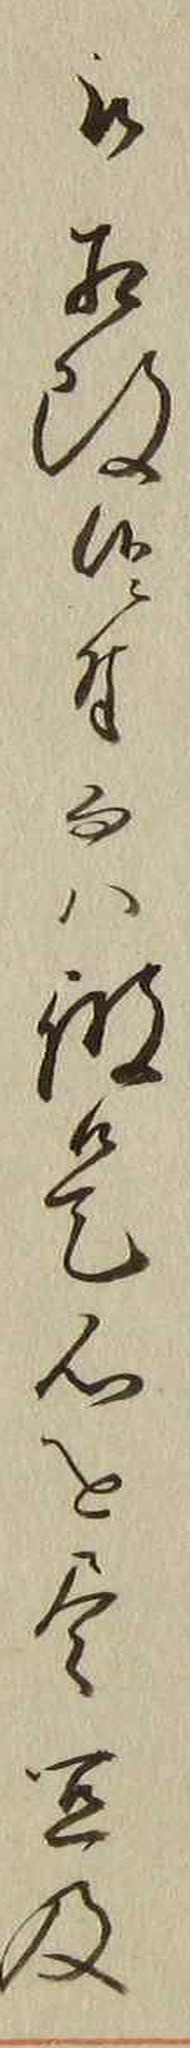被相改候ニ付彼是心を尽宜及
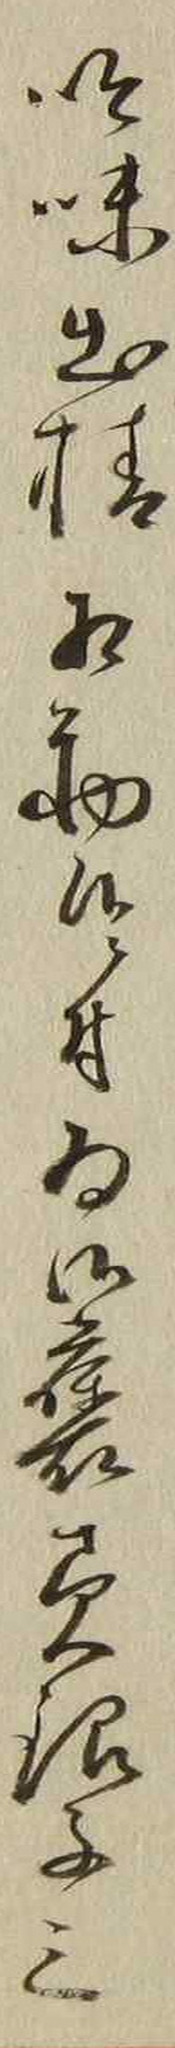吟味出精相勤候ニ付為御褒美銀子三
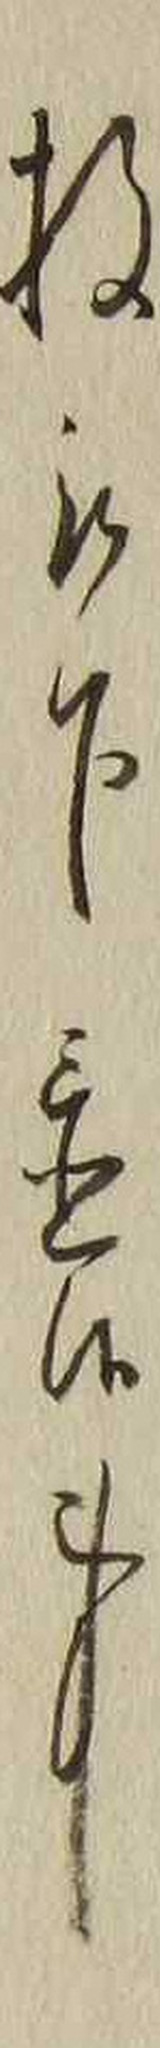枚被下置候事
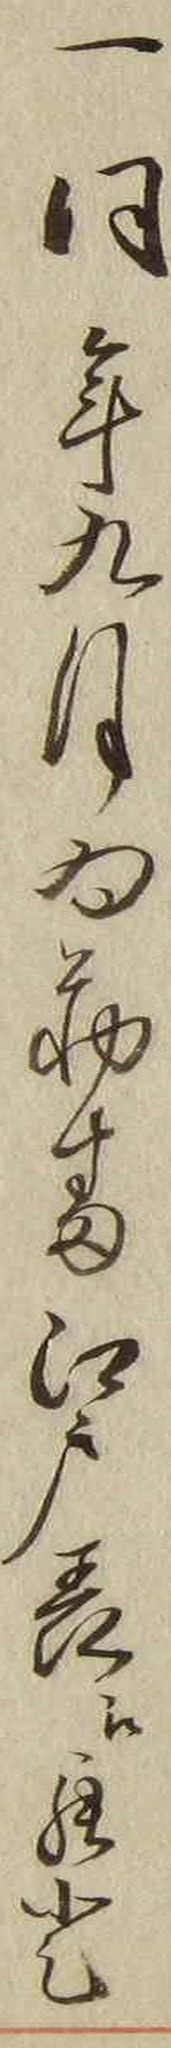一同年九月為勤番江戸表江罷登
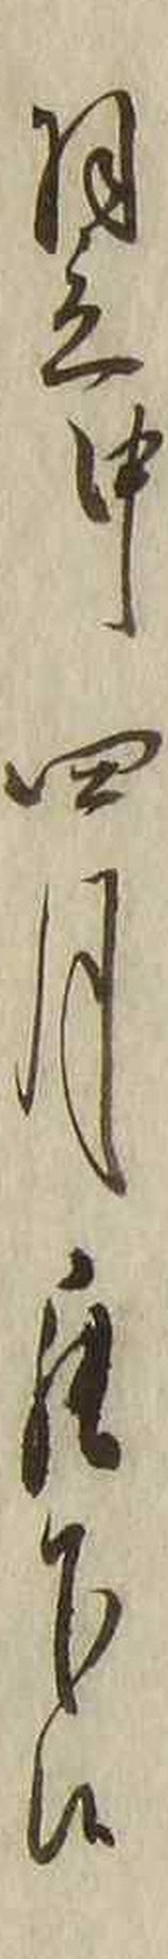翌申四月罷下候

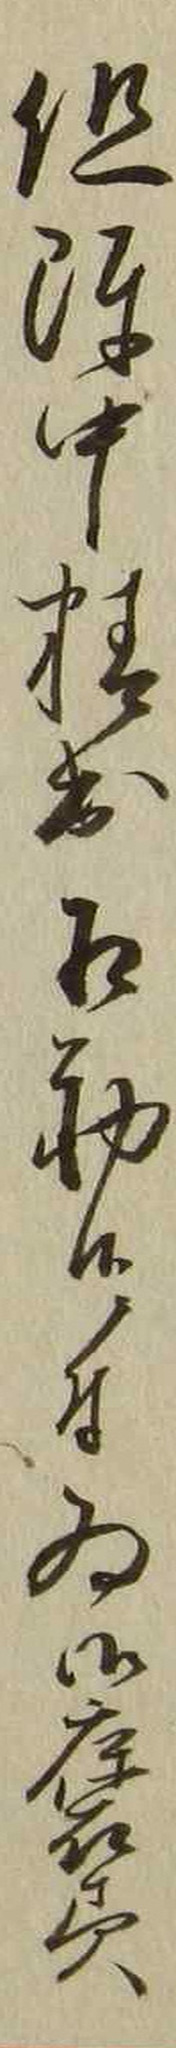但陣中精出相勤候ニ付為御褒美
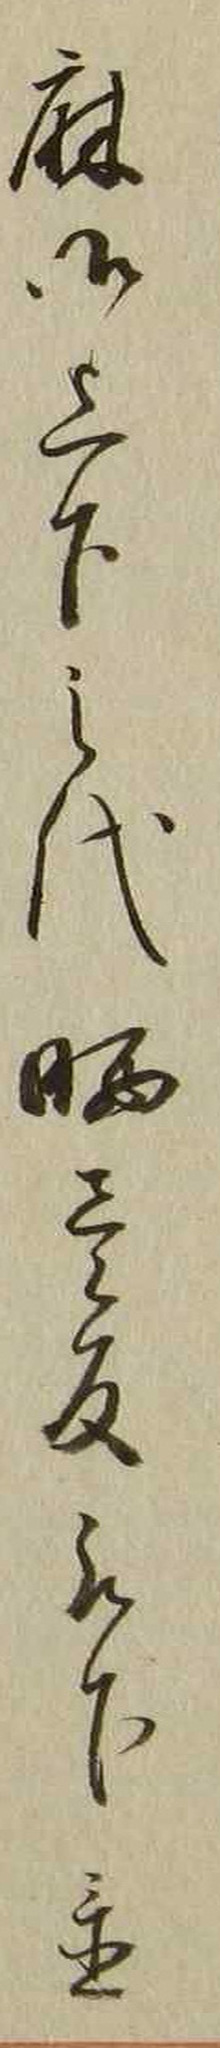麻御上下之代晒壱反被下置
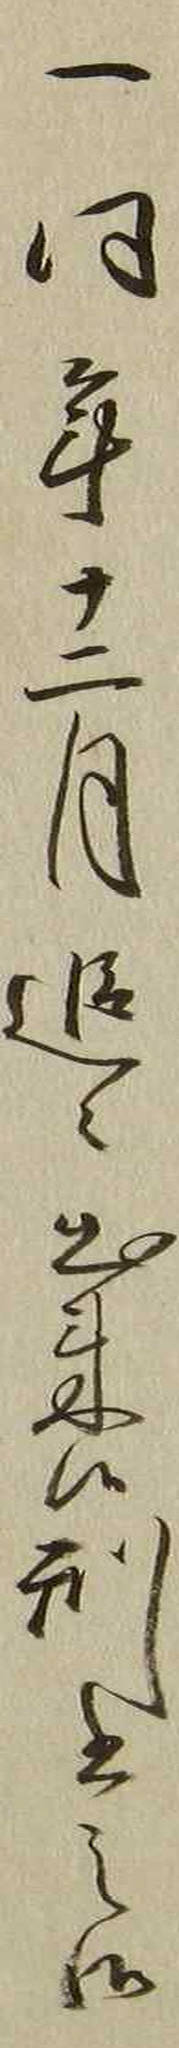一同年十二月追々出来候刑書之御
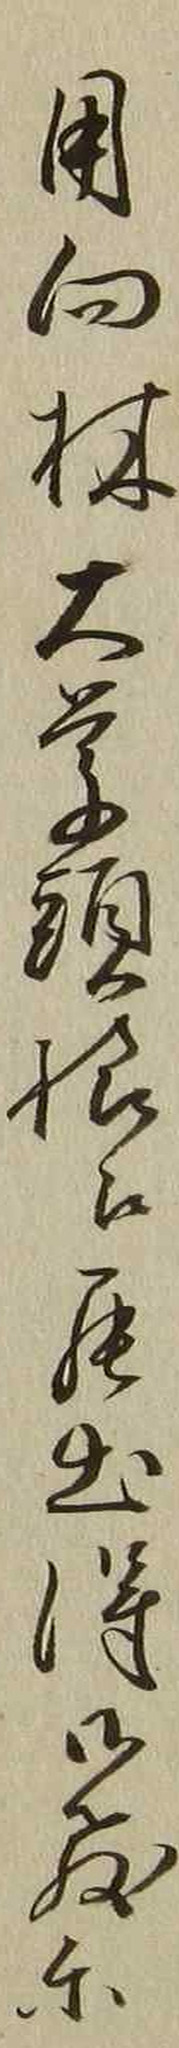用向林大学頭様江罷出得御教楽
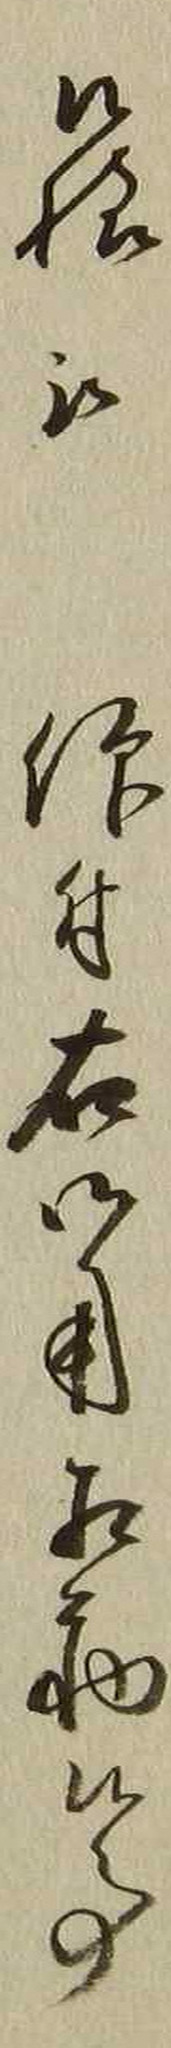候様被仰付右御用相勤候事
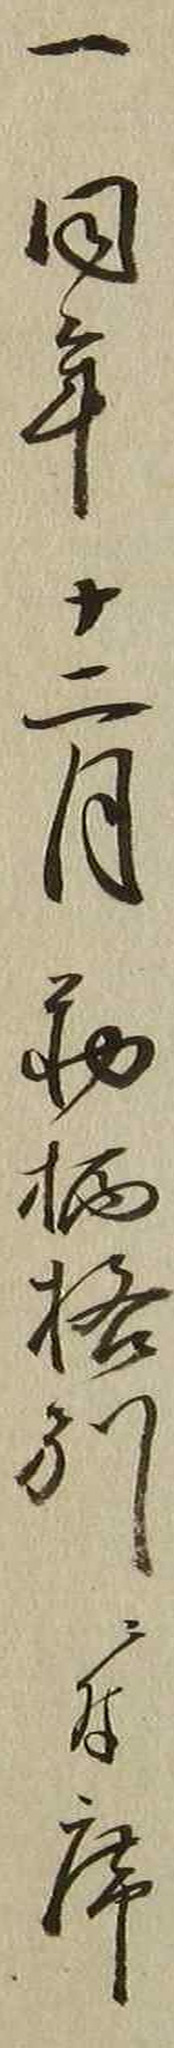一同年十二月勤柄格別ニ付席
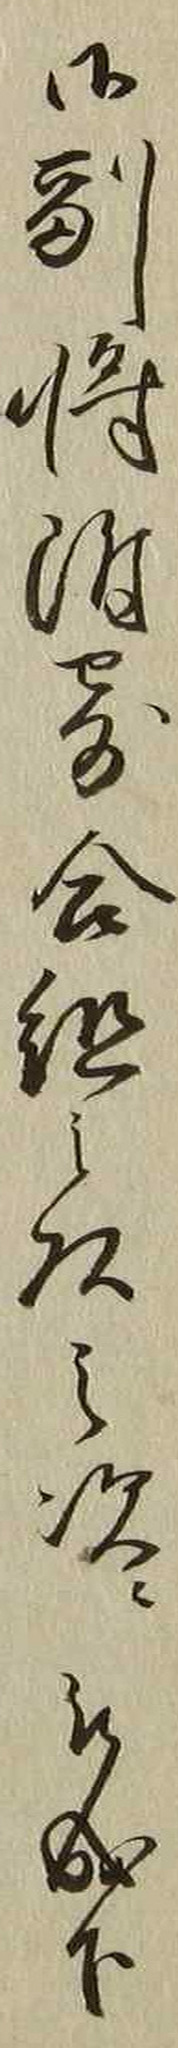御副将附寄合組之頭之次ニ被成下
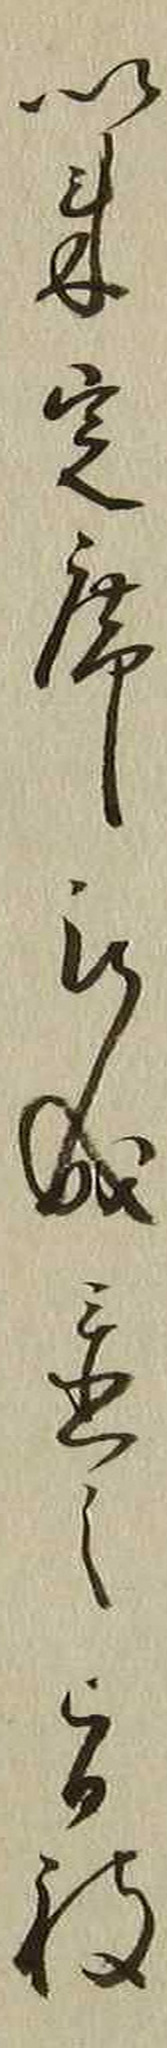以来定席被成置之旨被
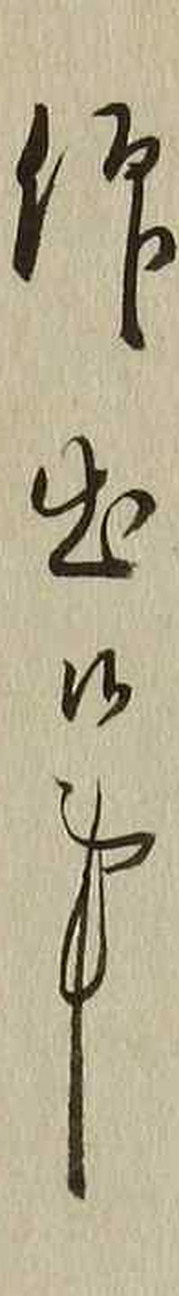仰出候事
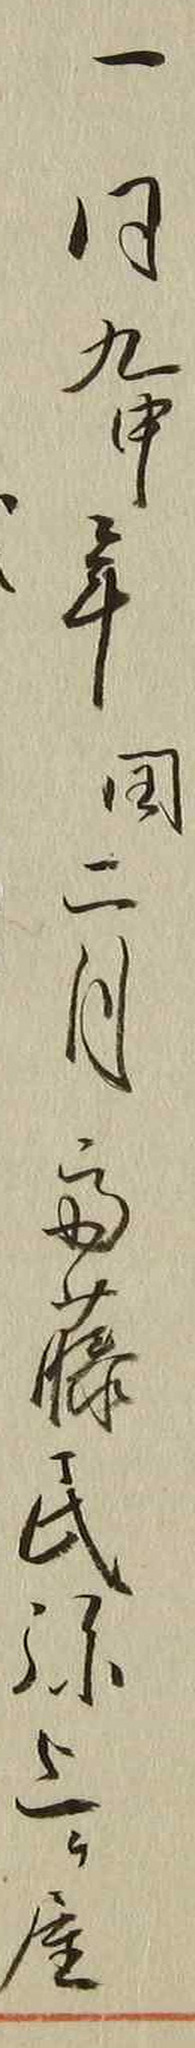一同九申年閏二月斉藤民弥上ケ屋
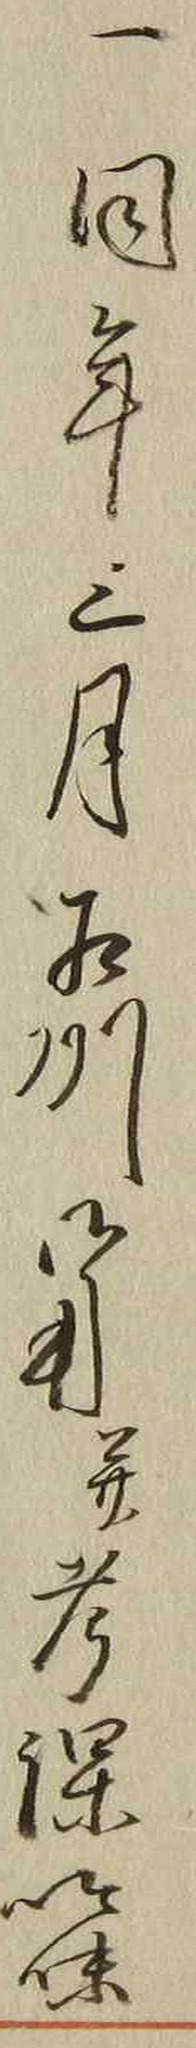一同年三月相州御用并考深吟味
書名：諸士系譜　巻之68　を之部2
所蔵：会津若松市立会津図書館
